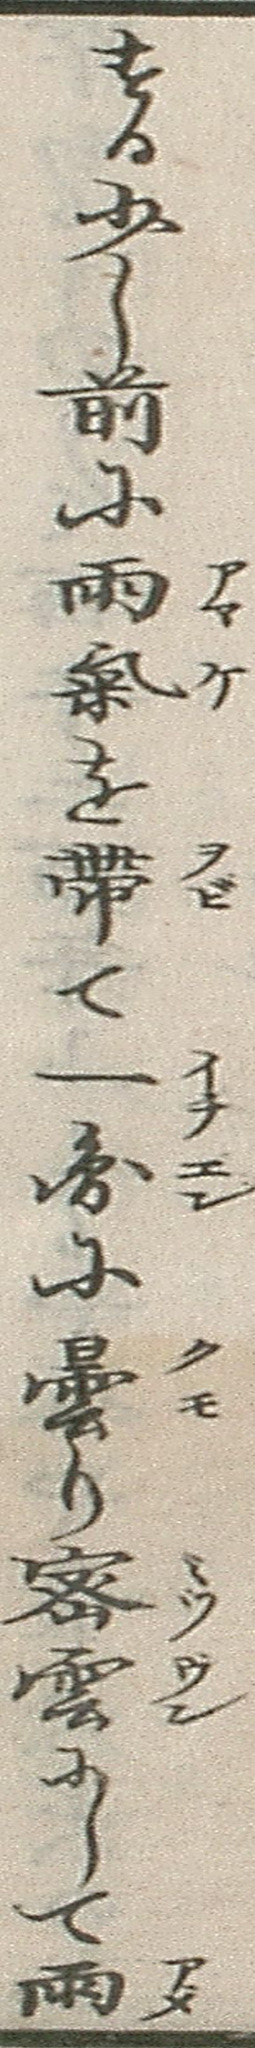する少し前に雨気を帯て一円に曇り密雲にして雨
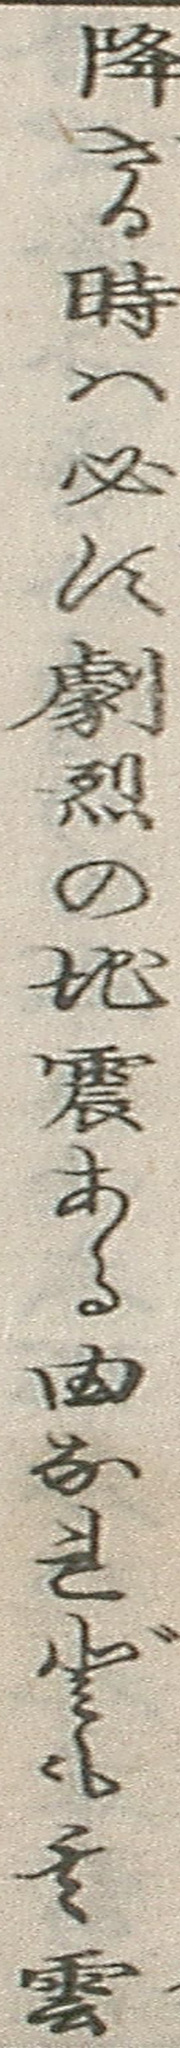降ざる時は必ず劇烈の地震ある由なれども其雲
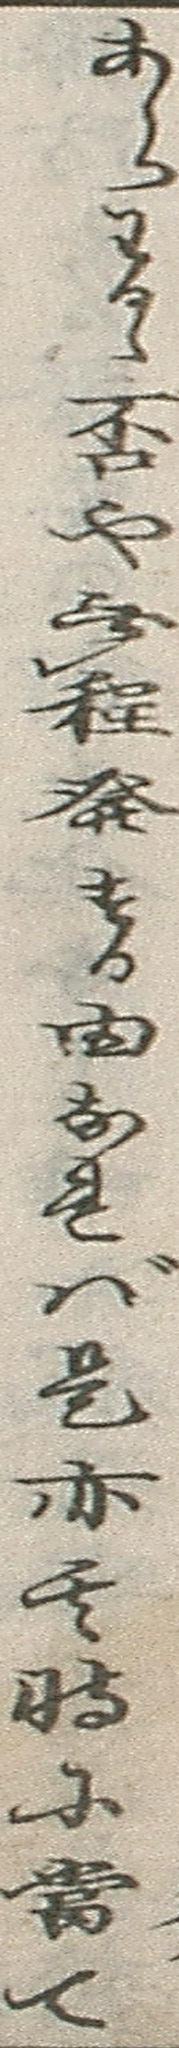あらわるゝ否や無程発する由なれば是亦其時に当て
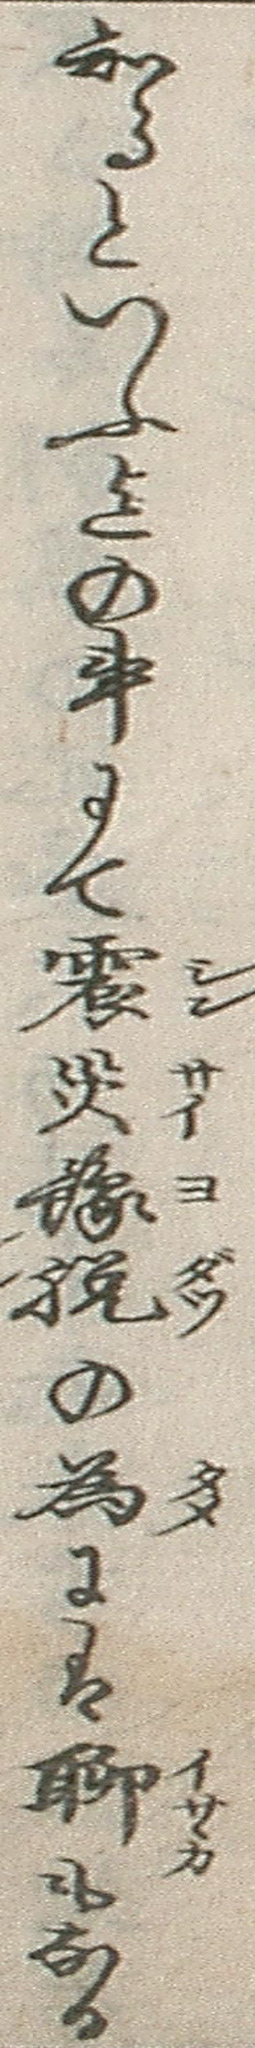知るといふ迄の事にて震災予脱の為には聊もなる
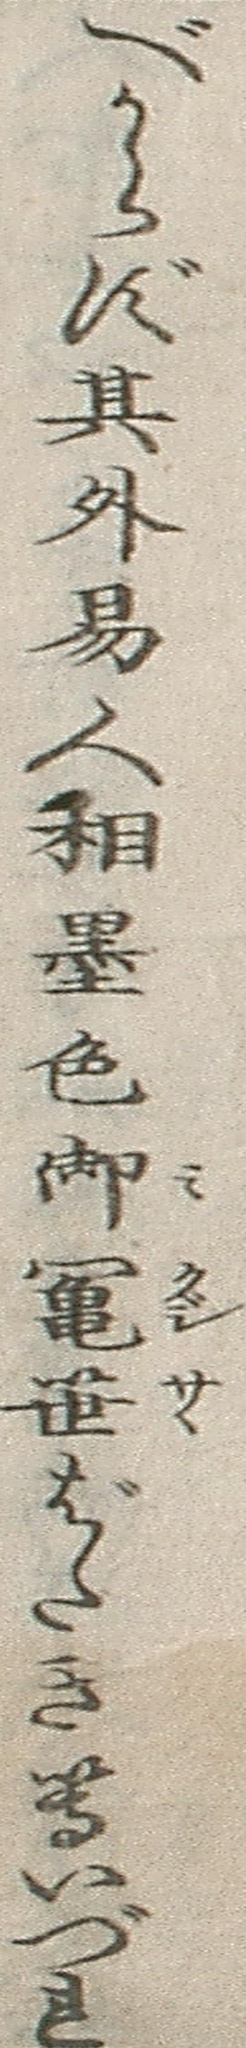べからず其外易人相墨色御籤笹ばたき等いづれ
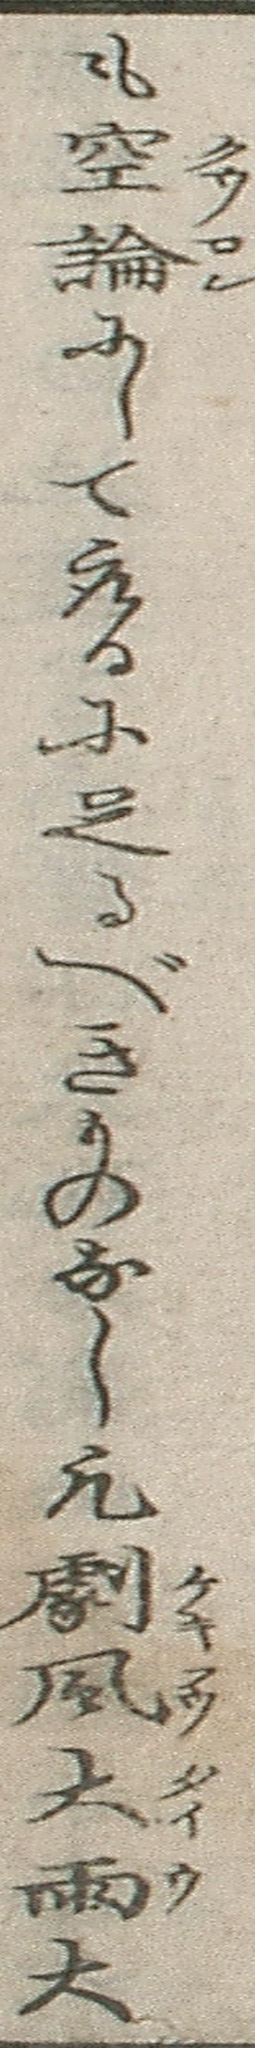も空論にして取るに足るべきものなし凡劇風大雨大

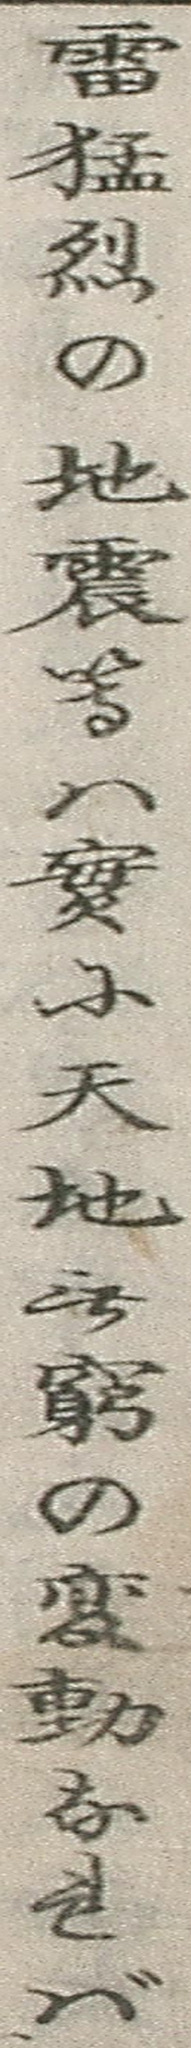雷猛烈の地震等は実に天地無窮の変動なれば
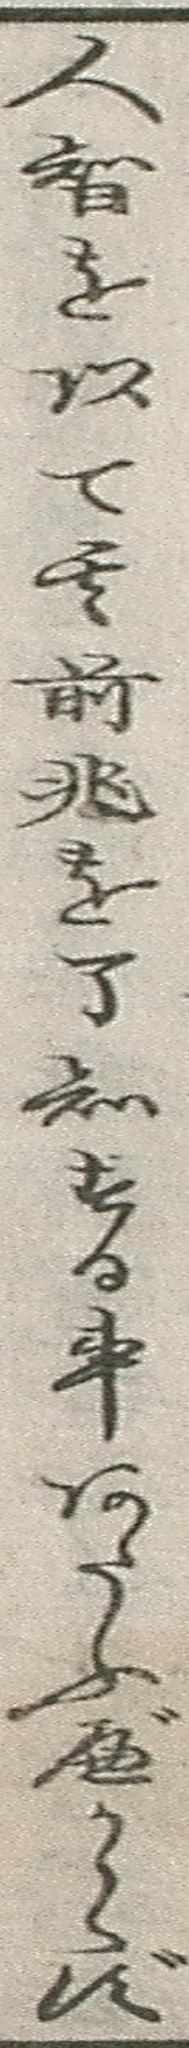人智を以て其前兆を了知する事あたふべからず
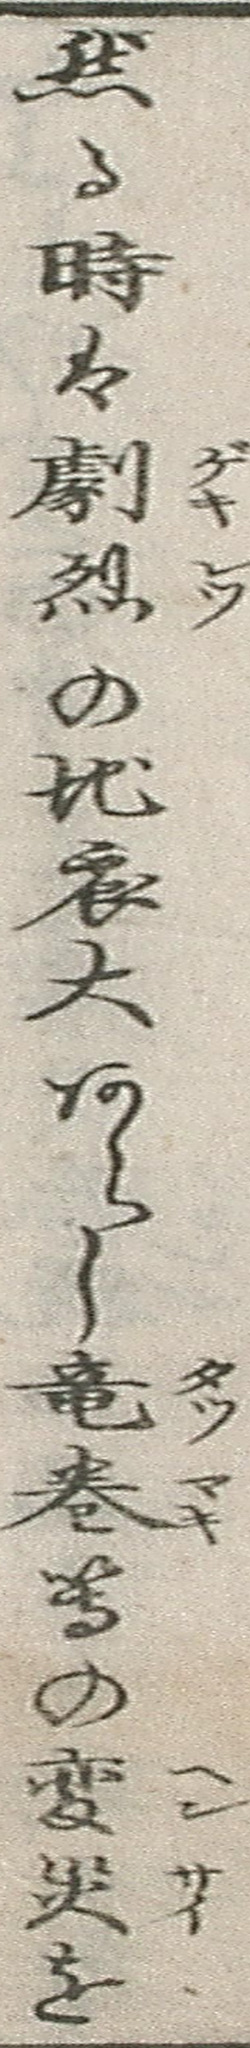然る時は劇烈の地震大あらし竜巻等の変災を
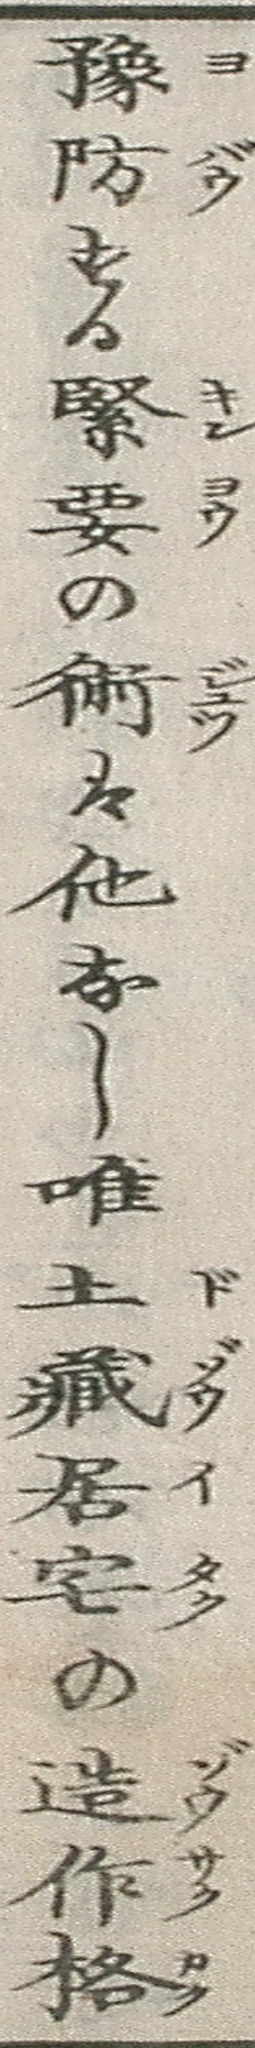予防する緊要の術は他なし唯土蔵居宅の造作格
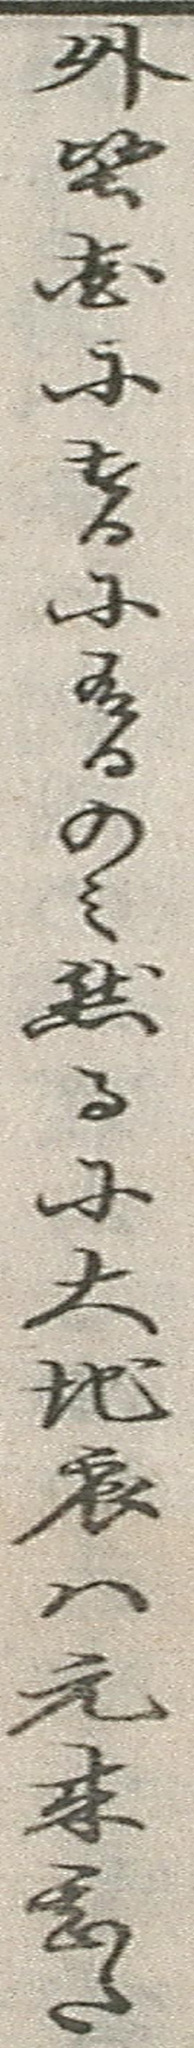外堅固にするに有るのみ然るに大地震は元来甚た
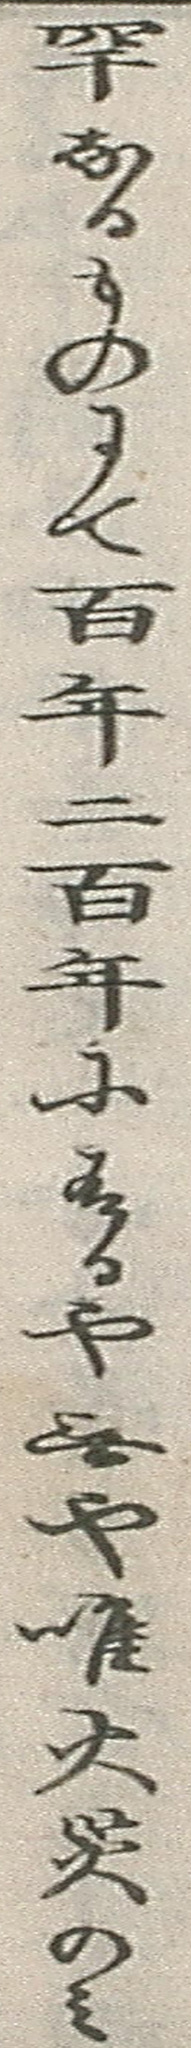罕なるものにて百年二百年に有るや無や唯火災のみ
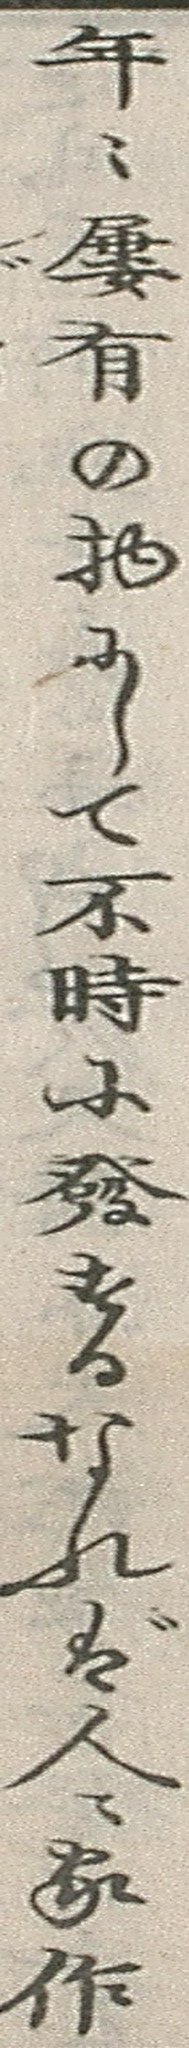年〻屡有の物にして不時に発するなれば人〻家作
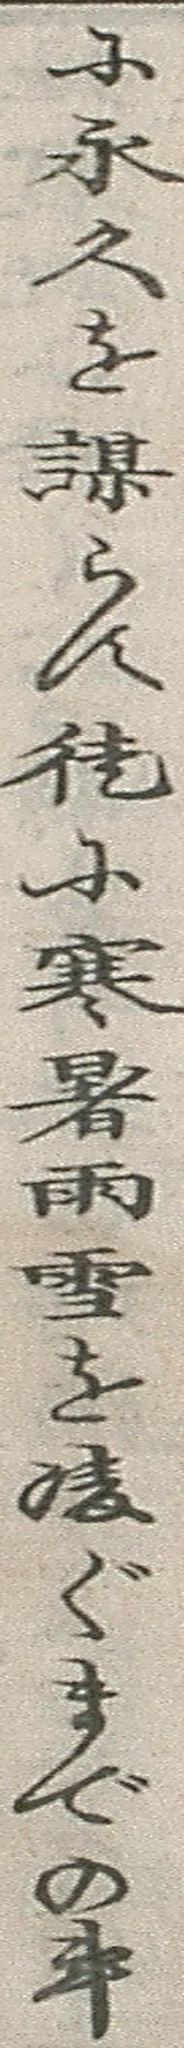に永久を謀らす徒に寒暑雨雪を凌ぐまでの事
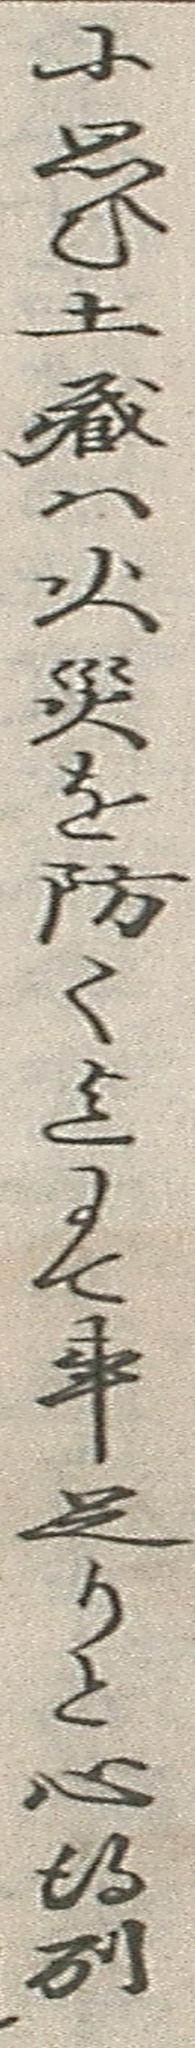に思ひ土蔵は火災を防く迄にて事足りと心得別して
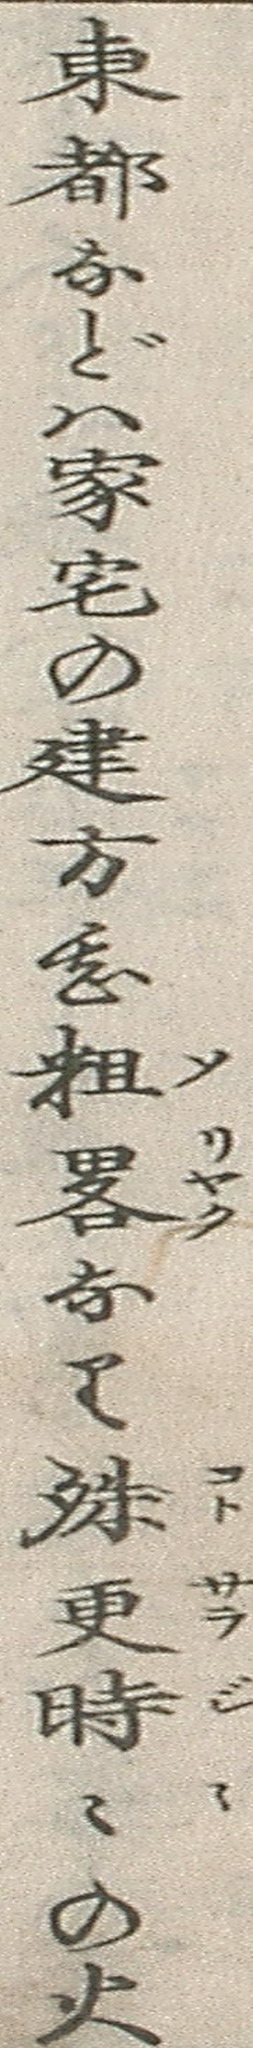東都などは家宅の建方甚粗略なり殊更時〻の火
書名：附録　地震劇風災害豫防法圖説（内題）
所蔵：東京大学地震研究所図書室 Earthquake Research Institute Library, The University of Tokyo, JAPAN
